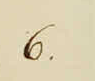6.
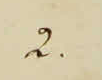2.
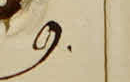9.
